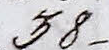38
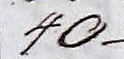40
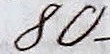80
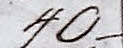40
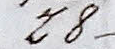28
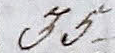35
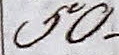50
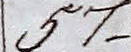57
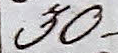30
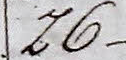26
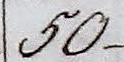50
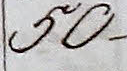50
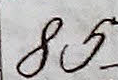85
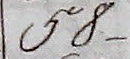58
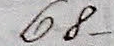68
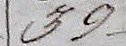39
